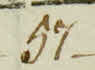57
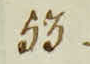53
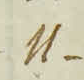11
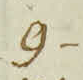9
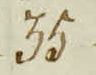35
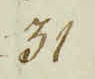31
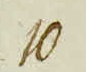10
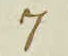7
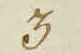3
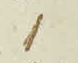1
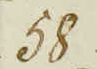58
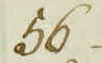56
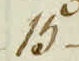15
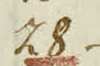28
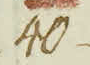40
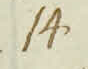14
